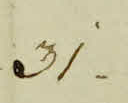31
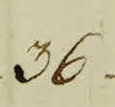36
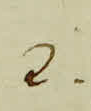2
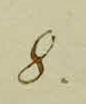8
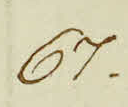67
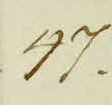47
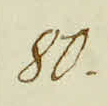80
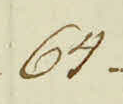64
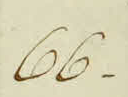66
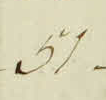51
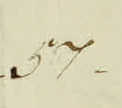57
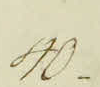40
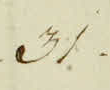31
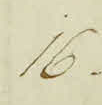16
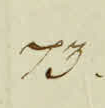73
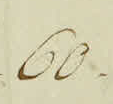60
